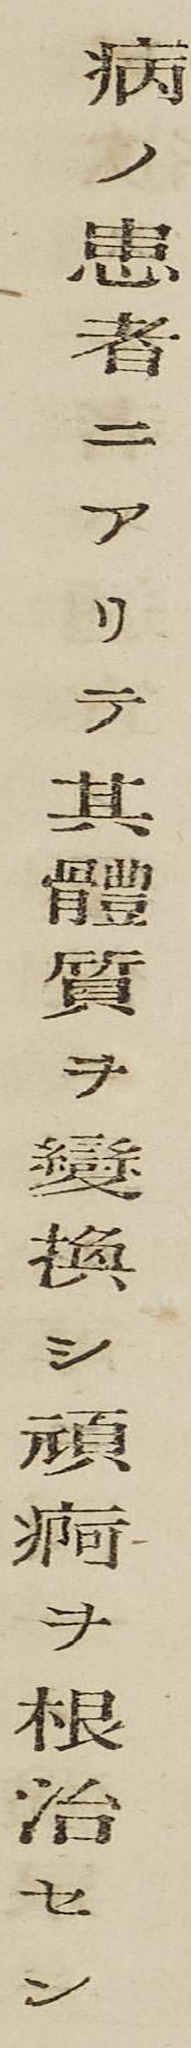病ノ患者ニアリテ其体質ヲ変換シ頑痾ヲ根治セン

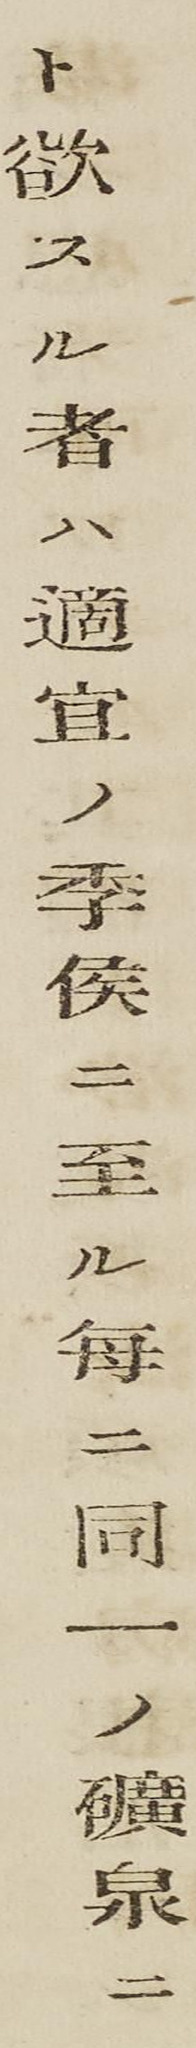ト欲スル者ハ適宜ノ気侯ニ至ル毎ニ同一ノ礦泉ニ
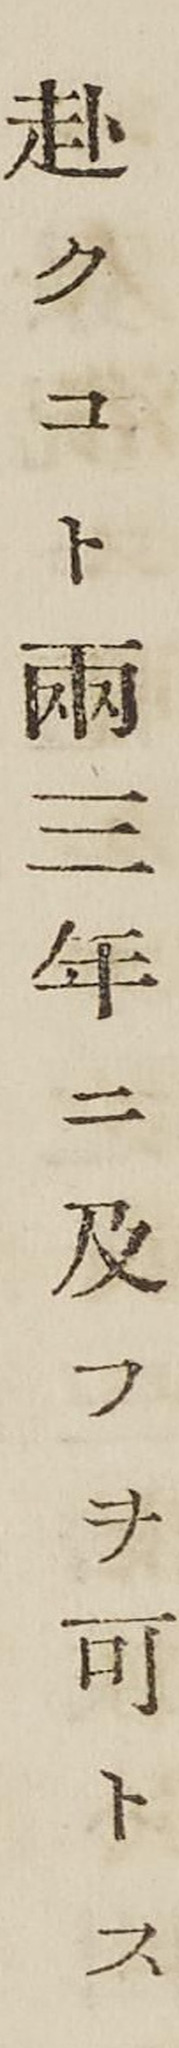赴クコト両三年ニ及フヲ可トス
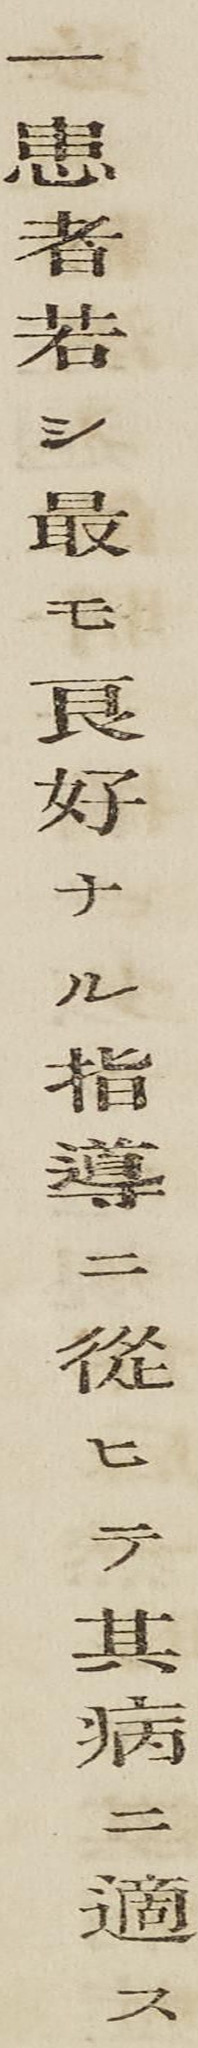一患者若シ最モ良好ナル指導ニ従ヒテ其病ニ適ス
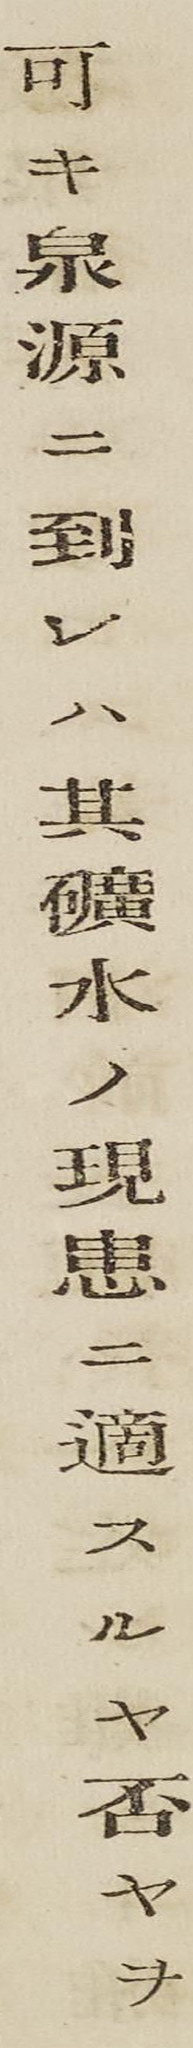可キ泉源ニ到レハ其礦水ノ現患ニ適スルヤ否ヤヲ
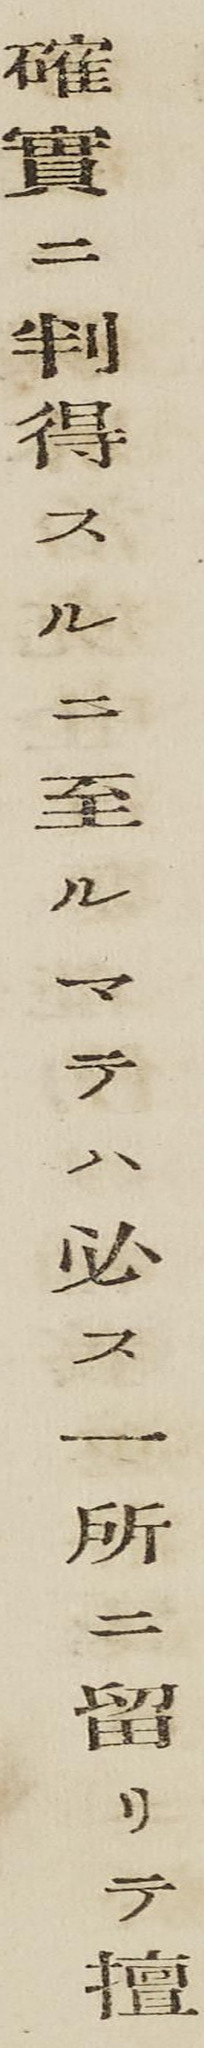確実ニ判得スルニ至ルマテハ必ス一所ニ留リテ擅
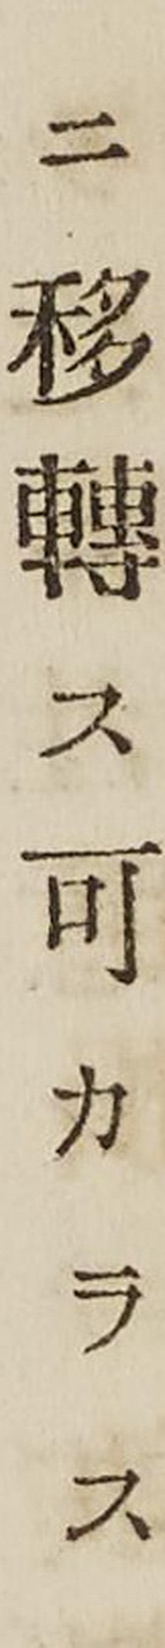ニ移転ス可カラス
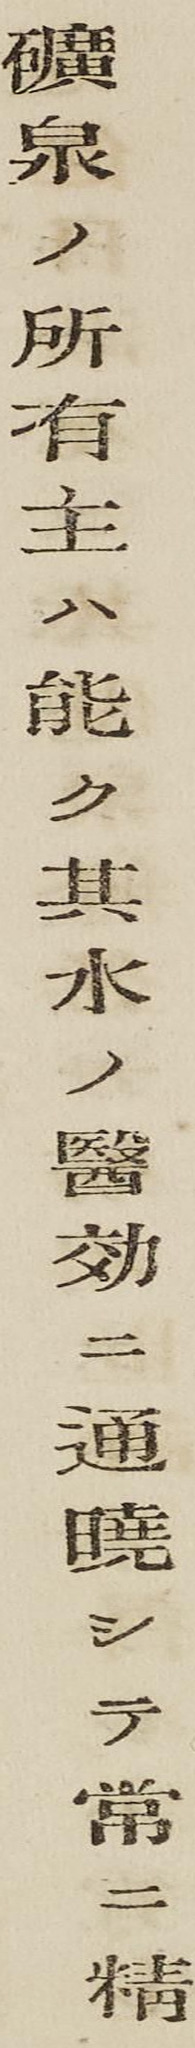礦泉ノ所有主ハ能ク其水ノ医効ニ通暁シテ常ニ精
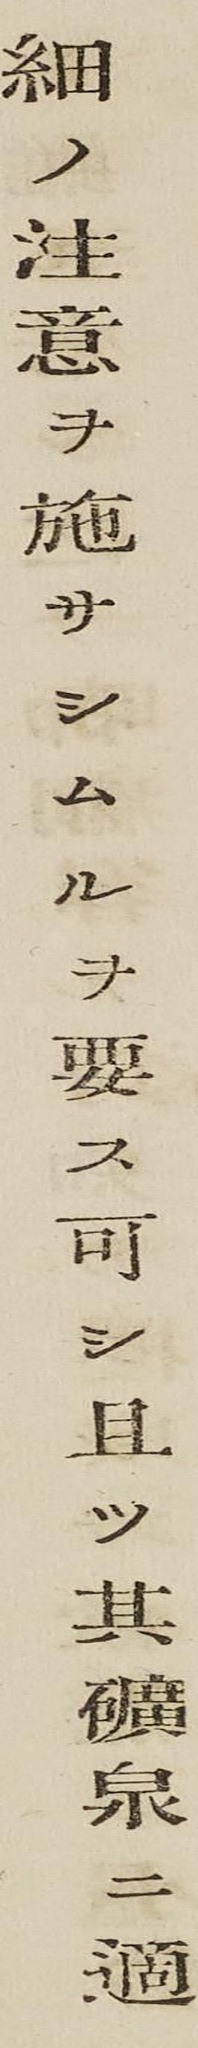細ノ注意ヲ施サシムルヲ要ス可シ且ツ其礦泉ニ適
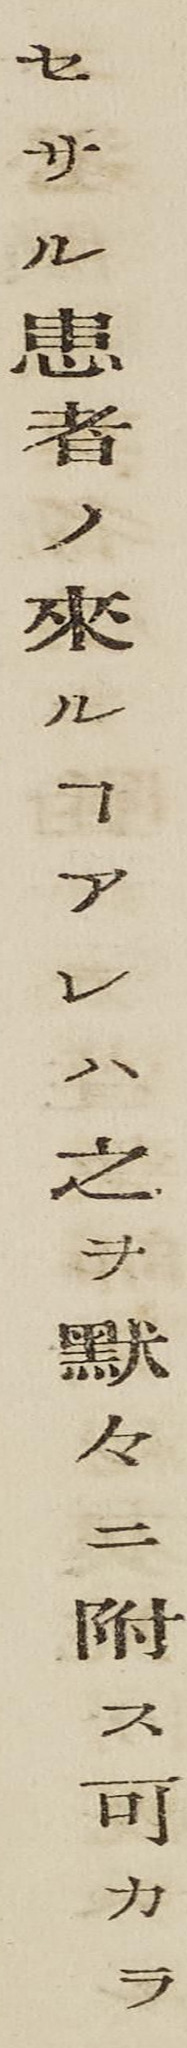セサル患者ノ来ルコトアレハ之ヲ黙々ニ附ス可カラ
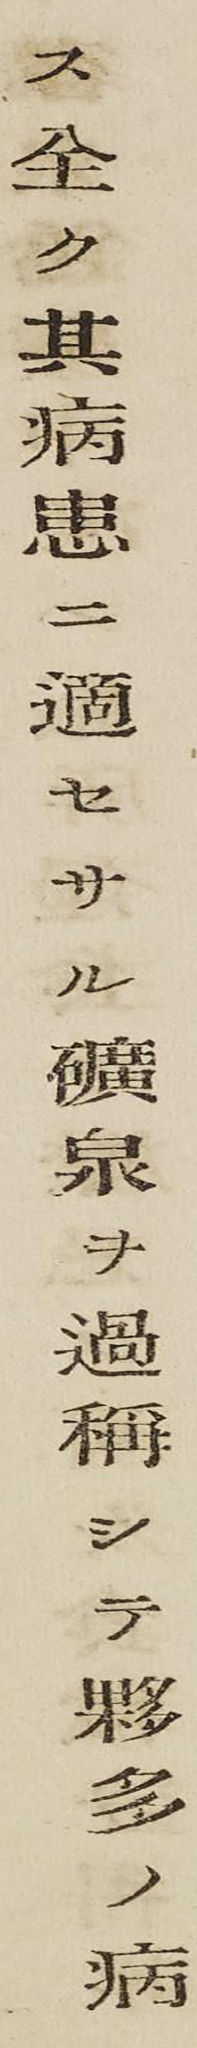ス全ク其病患ニ適セサル礦泉ヲ過称シテ夥多ノ病
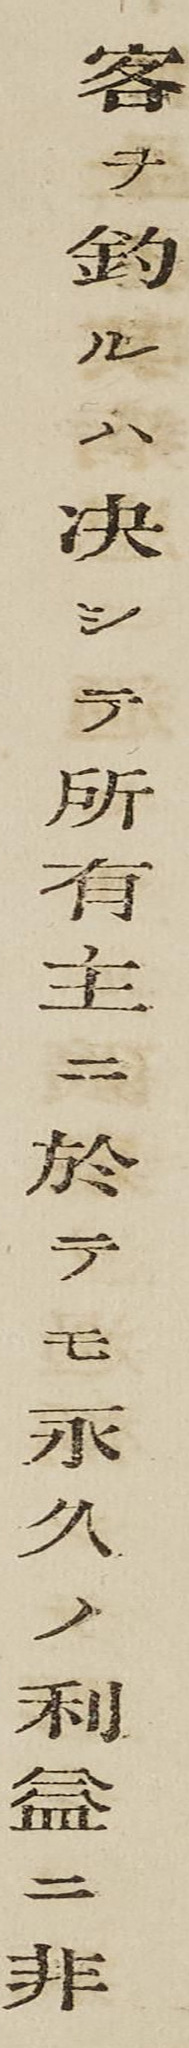客ヲ釣ルハ決シテ所有主ニ於テモ永久ノ利益ニ非
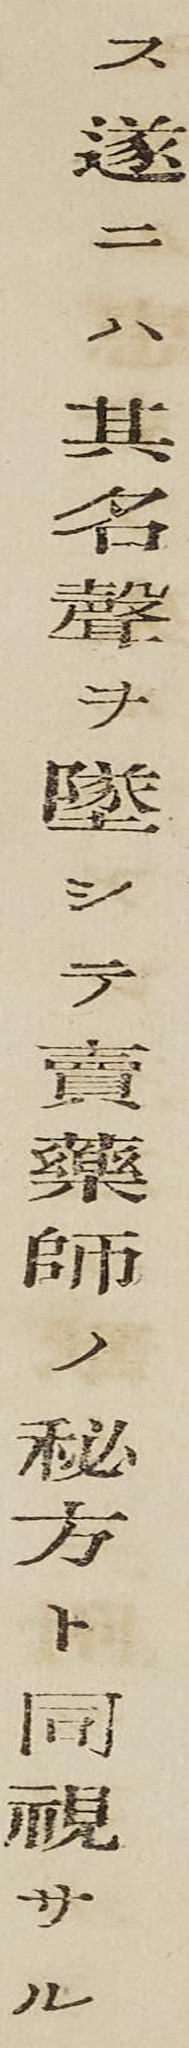ス遂ニハ其名声ヲ墜シテ売薬師ノ秘方ト同視サル
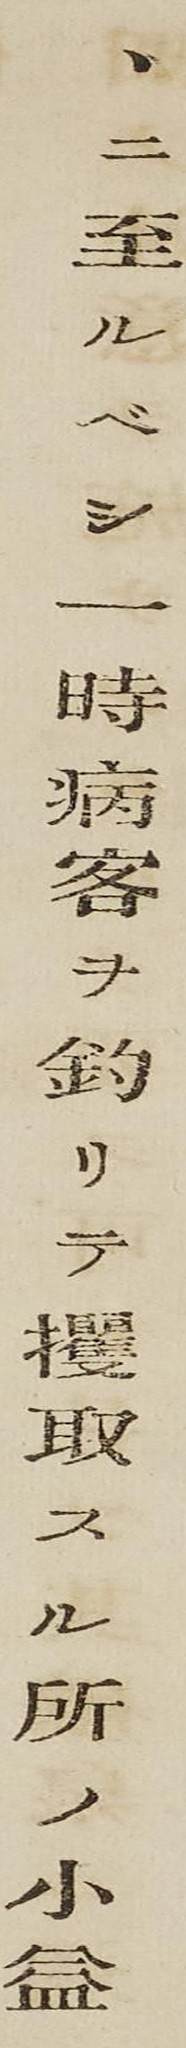ヽニ至ルベシ一時病客ヲ釣リテ攫取スル所ノ小益
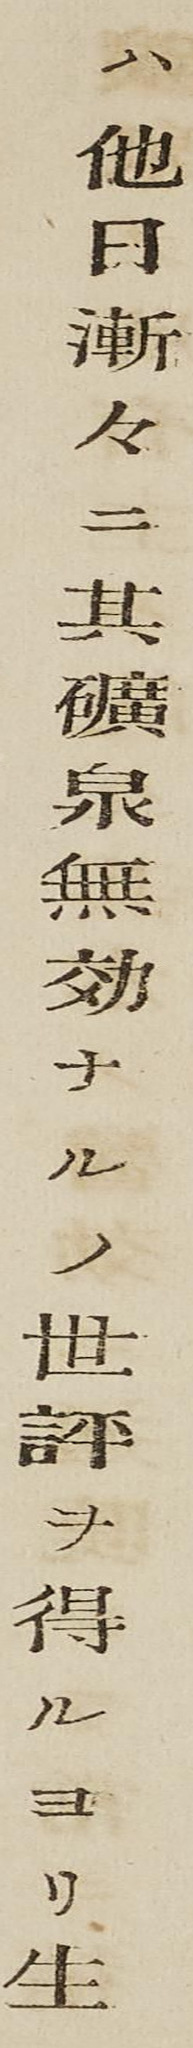ハ他日漸々ニ其礦泉無効ナルノ世評ヲ得ルヨリ生
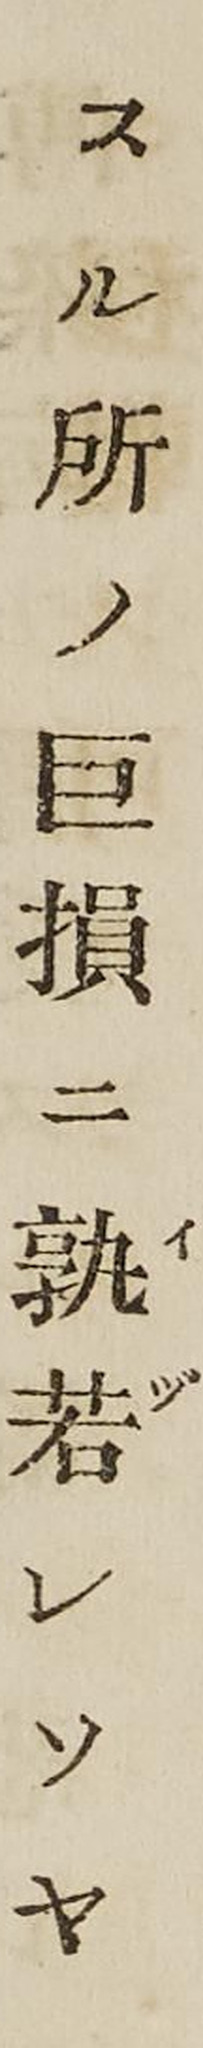スル所ノ巨損ニ孰若レソヤ
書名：日本温泉考
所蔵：東京大学地震研究所図書室 Earthquake Research Institute Library, The University of Tokyo, JAPAN
